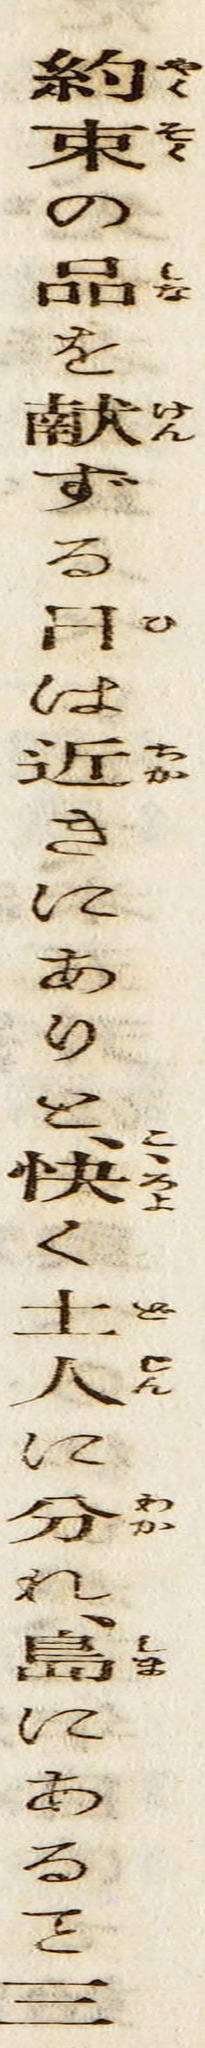約束の品を献ずる日は近きにありと、快く土人に分れ、島にあること三
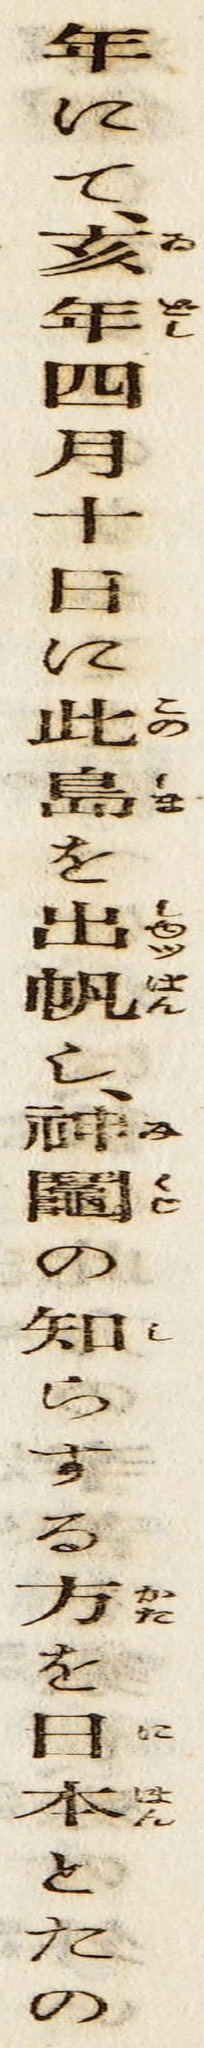年にて、亥年四月十日に此島を出帆し、神鬮の知らする方を日本とたの
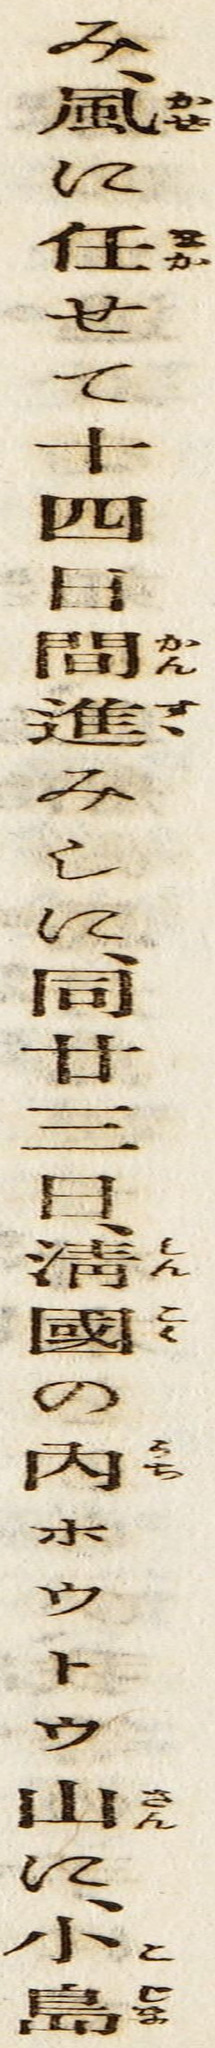み、風に任せて十四日間進みしに、同廿三日、清国の内ホウトウ山に、小島
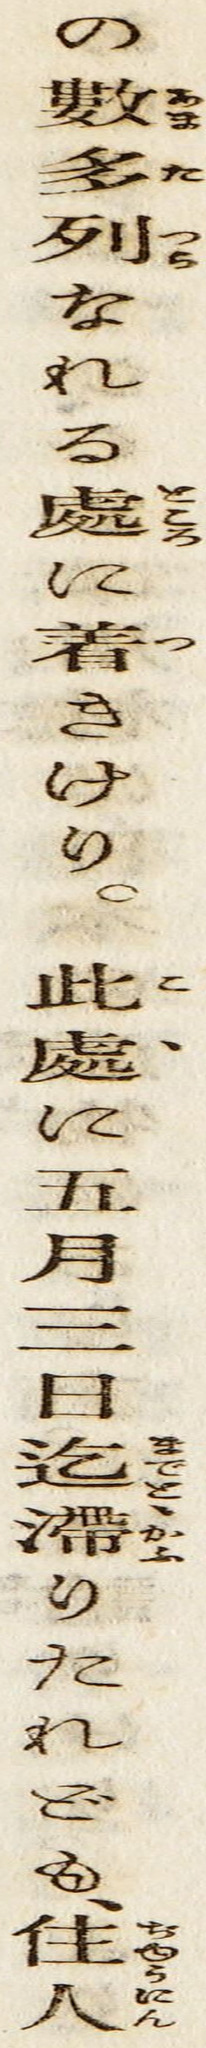の数多列なれる処に着きけり。此処に五月三日迄滞りたれども、住人
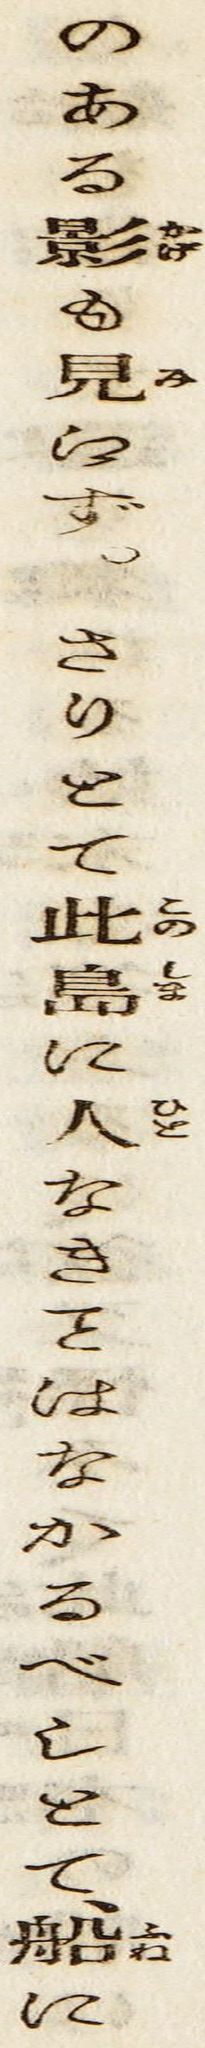のある影も見えず。、さりとて此島に人なきことはなかるべしとて、船に
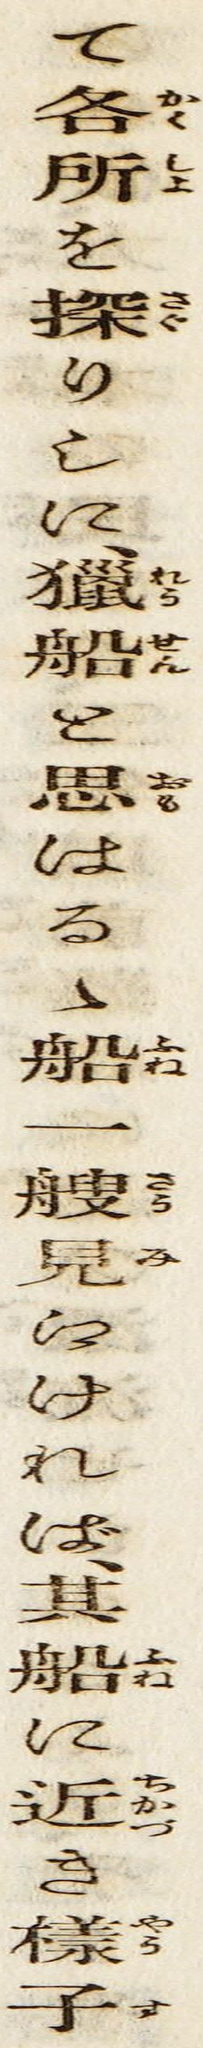て各所を探りしに、猟船と思はるゝ船一艘見えければ、其船に近き様子
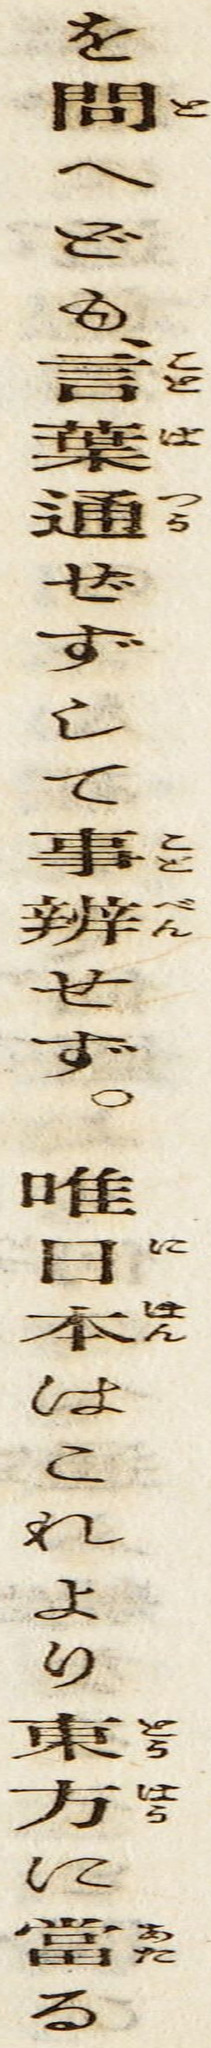を問へども、言葉通ぜずして事弁せず。唯日本はこれより東方に当る
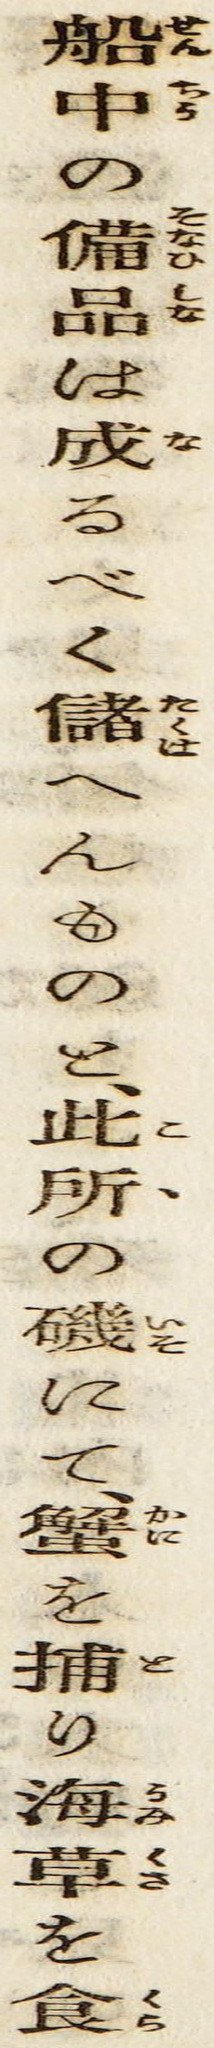船中の備品は成るべく儲へんものと、此所の磯にて、蟹を捕り海草を食
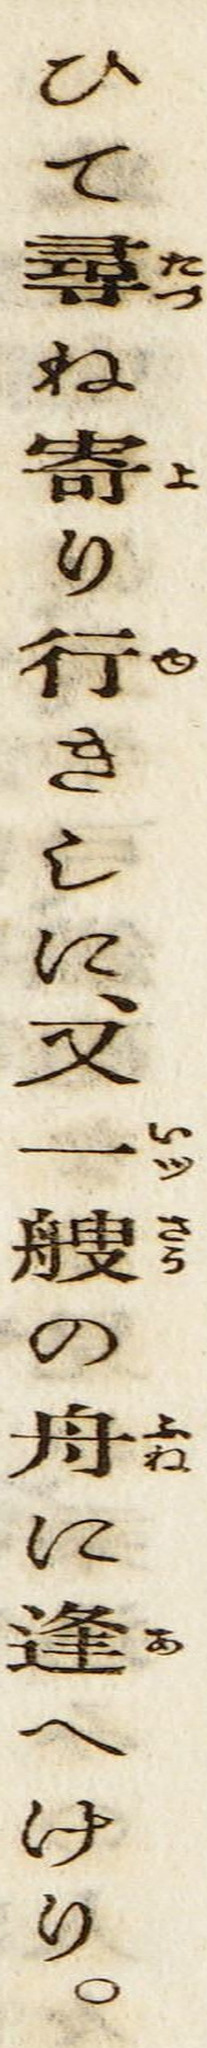ひて尋ね寄り行きしに、又一艘の舟に逢へけり。

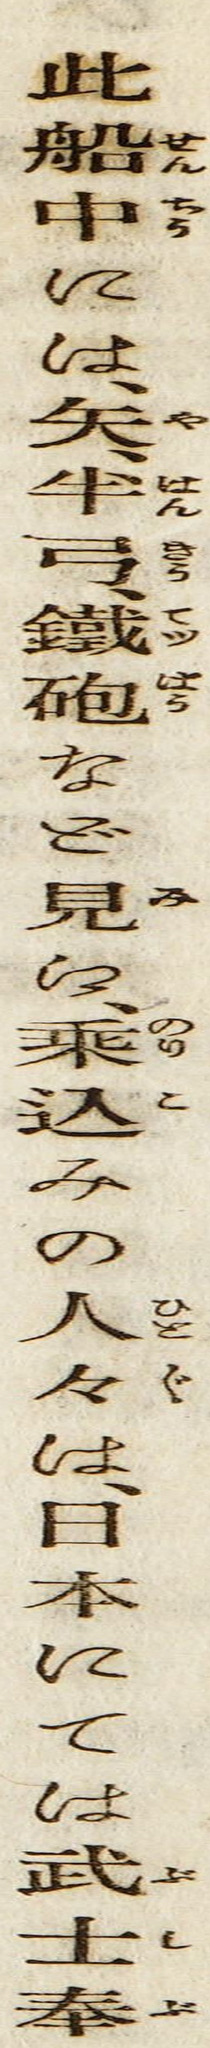此船中には、矢、半弓、鉄砲など見え、乗込みの人々は、日本にては武士奉
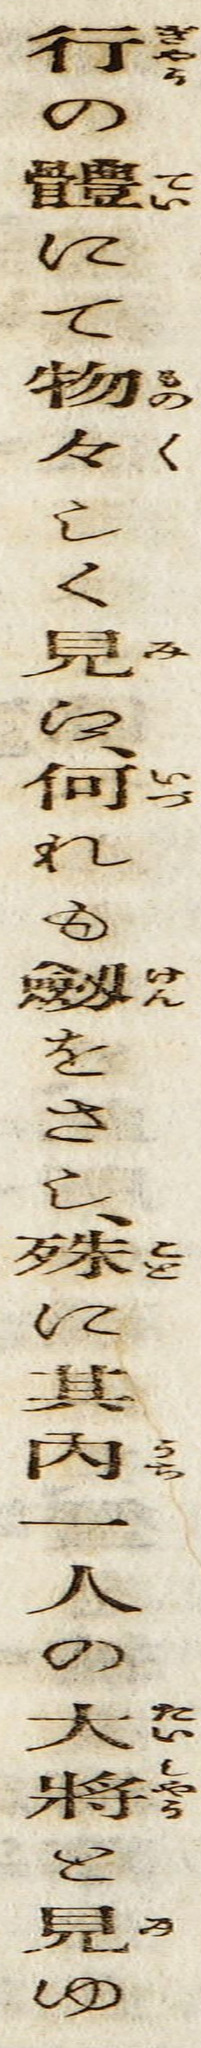行の体にて物々しく見え、何れも剣をさし、殊に其内一人の大将と見ゆ
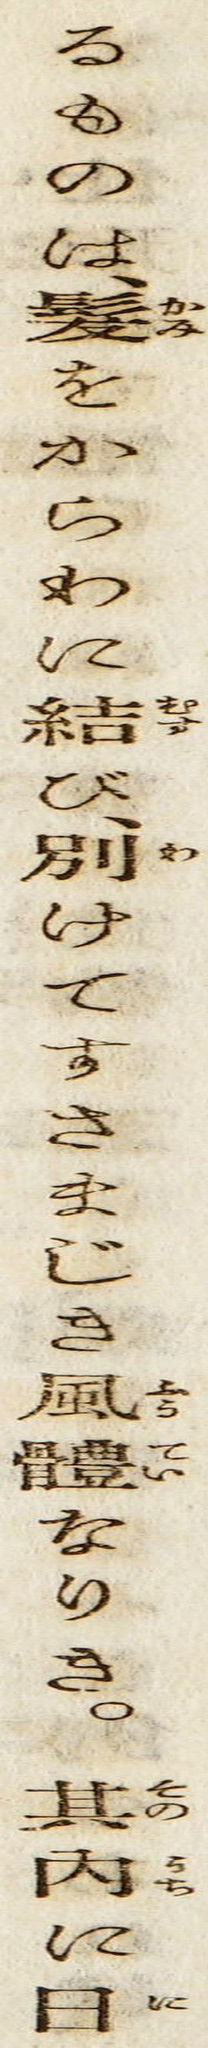るものは、髪をからわに結び、別けてすさまじき風体なりき。其内に日
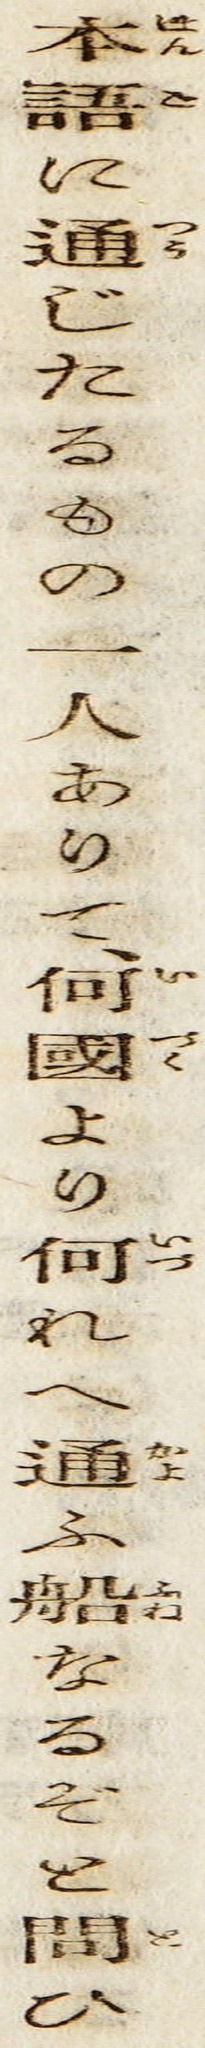本語に通じたるもの一人ありて、何国より何れへ通ふ船なるぞと問ひ
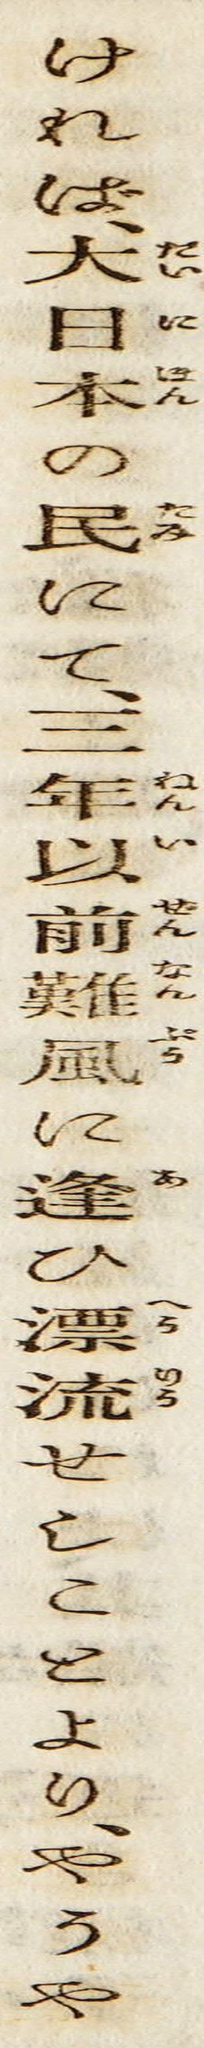ければ、大日本の民にて、三年以前難風に逢ひ漂流せしことより、やうや
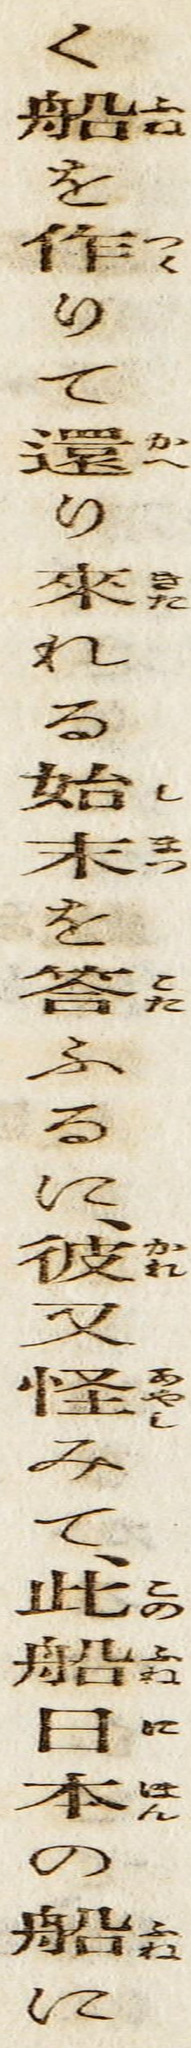く船を作りて還り来れる始末を答ふるに、彼又怪みて、此船日本の船に
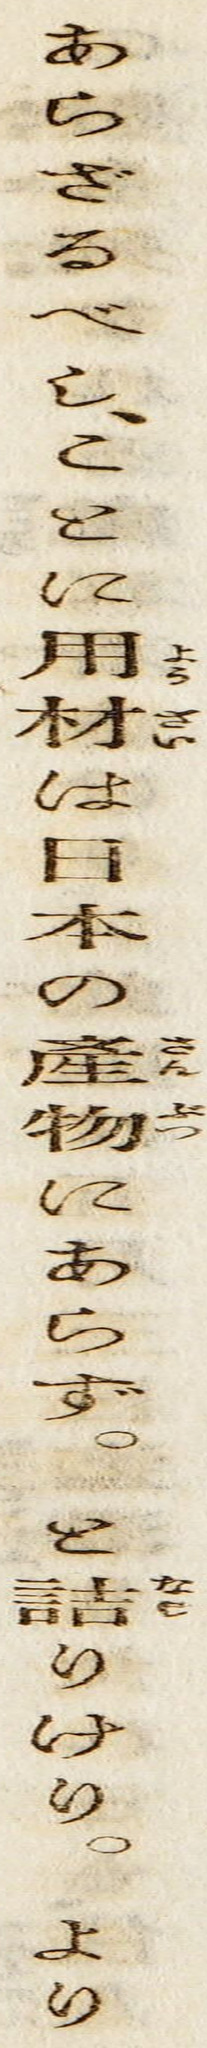あらざるべし、ことに用材は日本の産物にあらず。と詰りけり。より
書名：日本漂流譚
